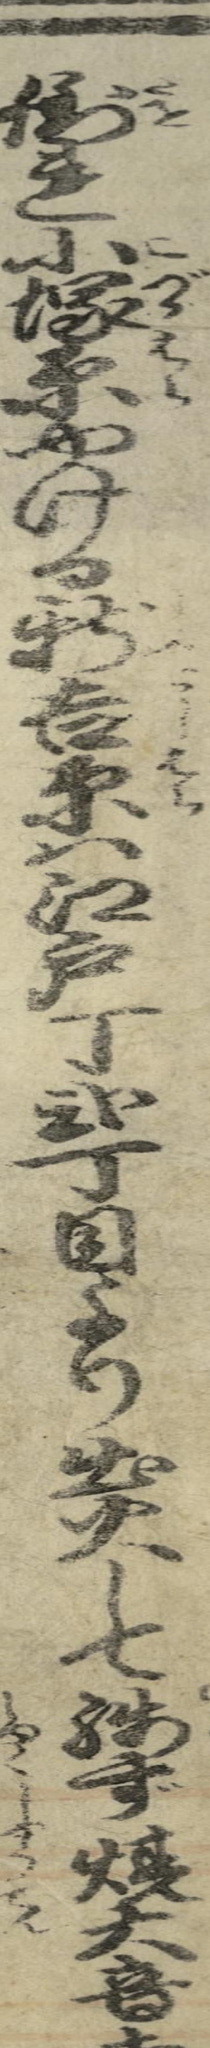倒れ小塚原やける新吉原は江戸丁弐丁目より出火して残ず焼大音寺
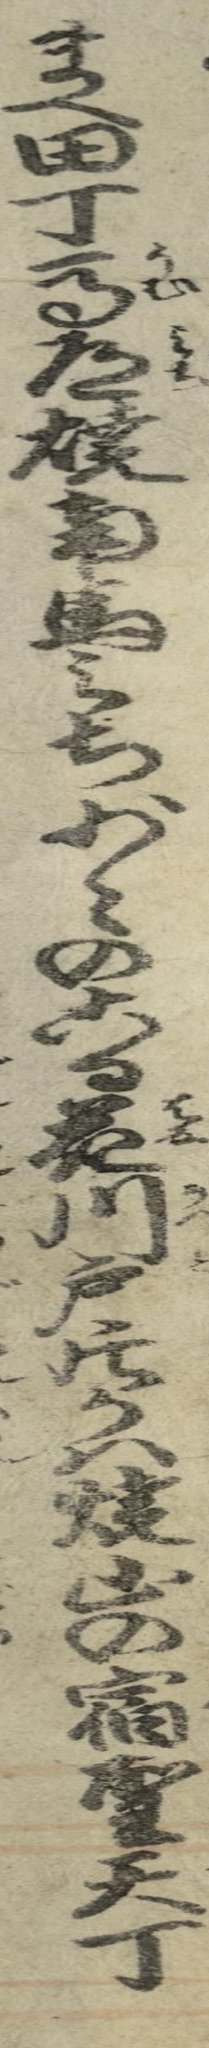まへ田丁馬道焼南馬みち少々のこる花川戸片かは焼山の宿聖天丁
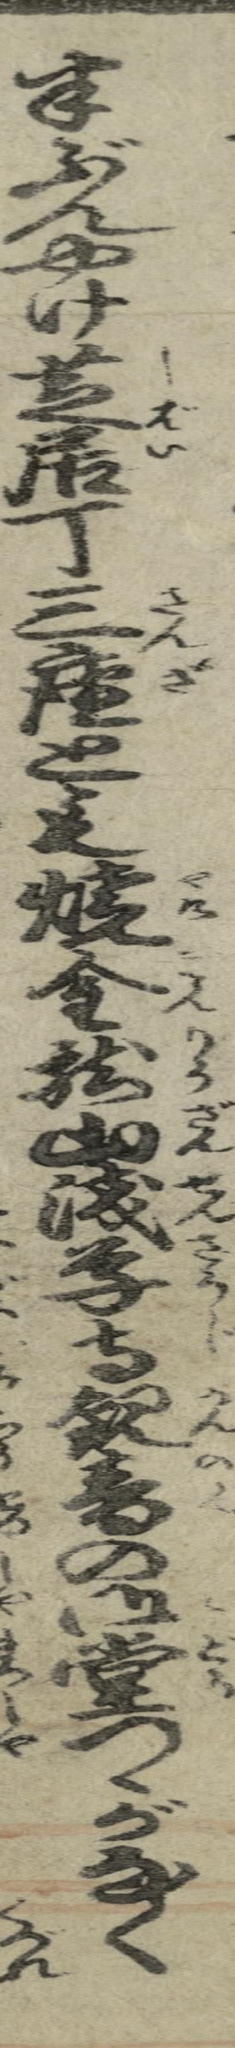半ぶんやけ芝居丁三座とも焼金龍山浅草寺観音の御堂つつゝがなく
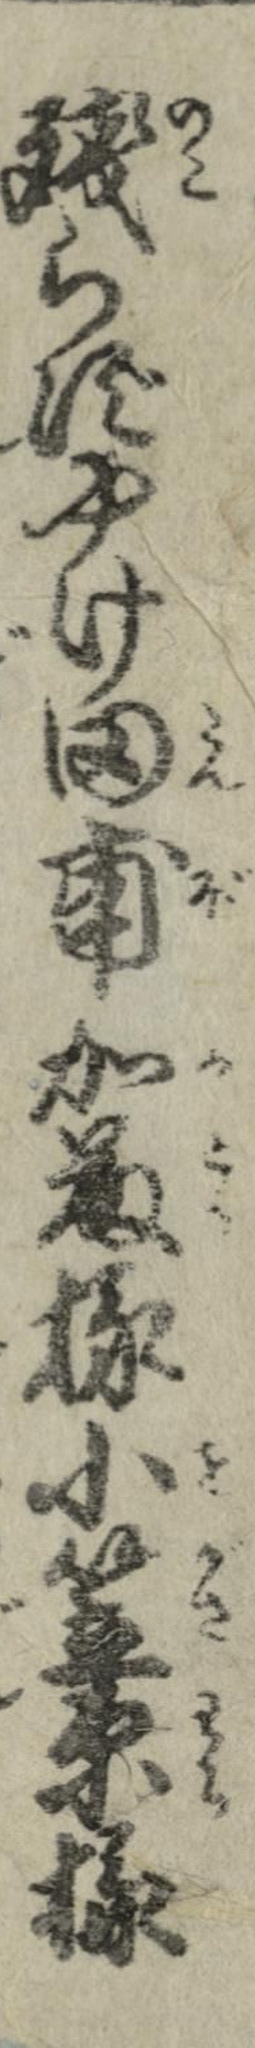残らずやけ田甫加藤様小笠原様
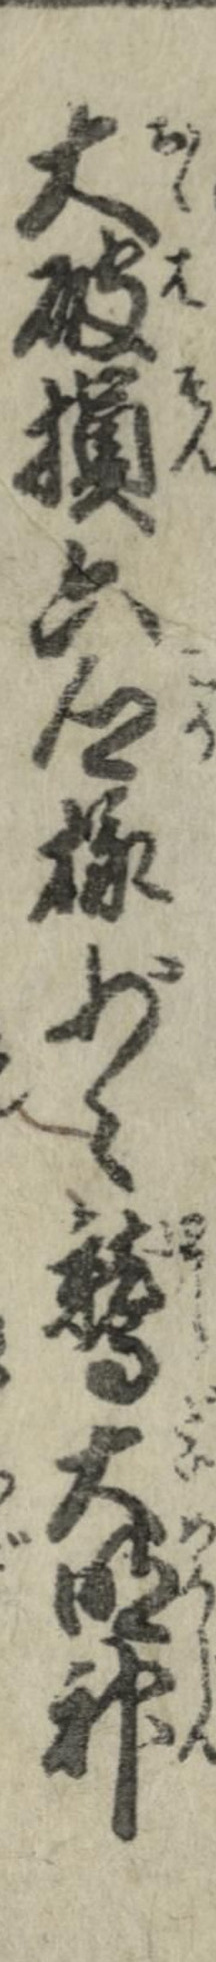大破損六郷様少々鷲大明神
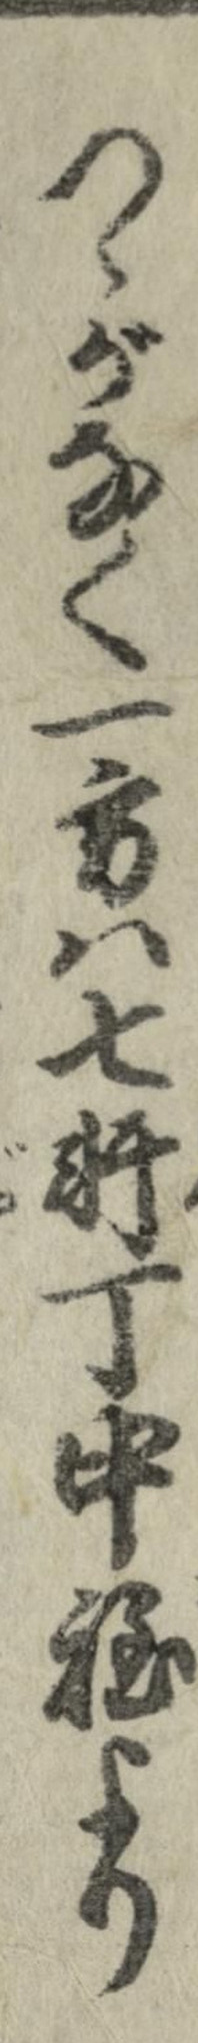つゝがなく一方は七軒丁中程より
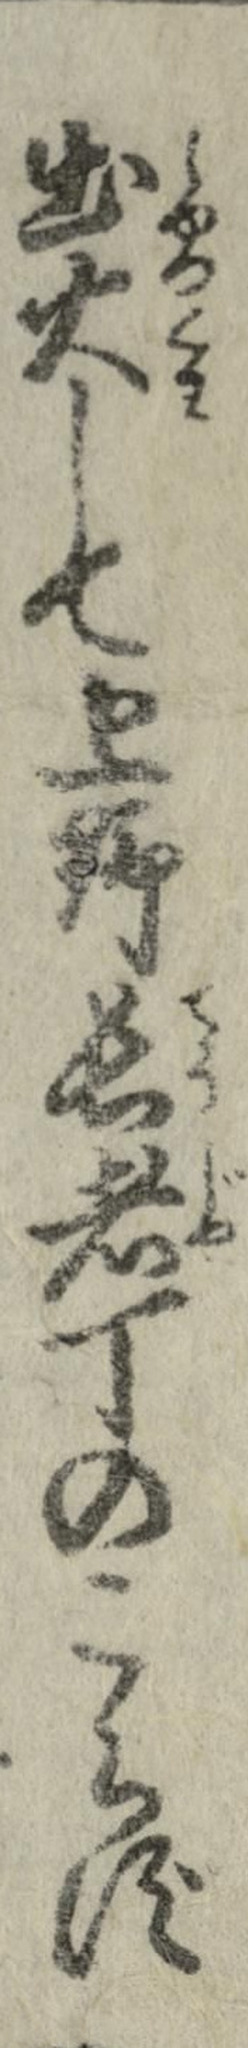出火して上野長者丁のこらず
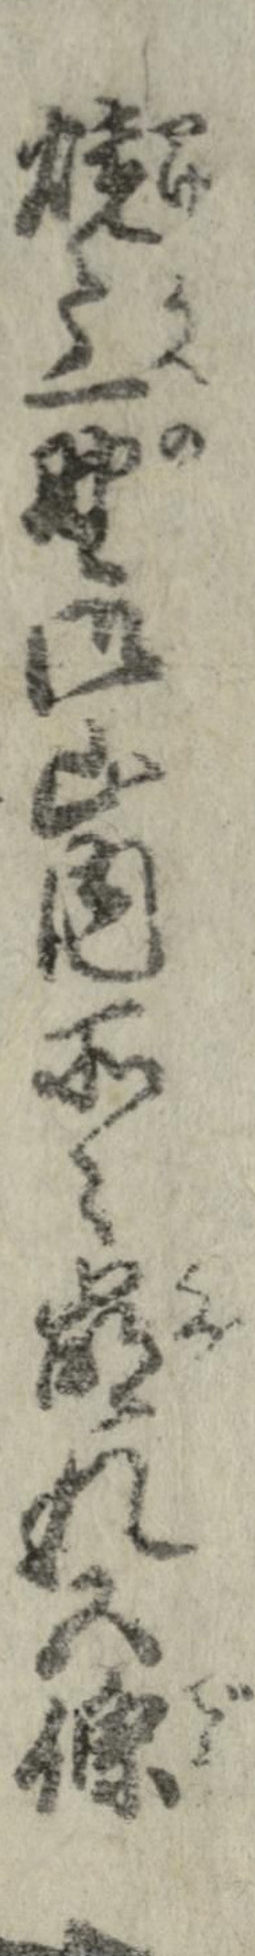焼上野御山内所々崩れ五條
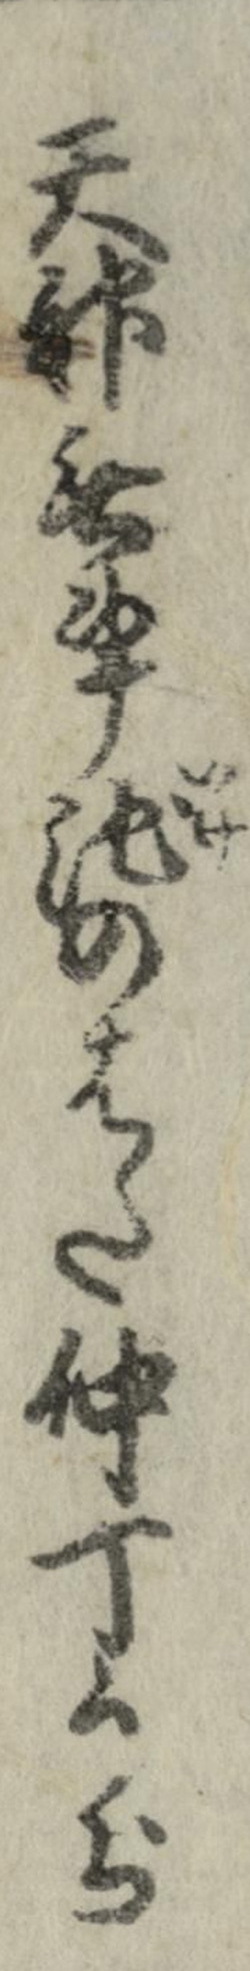天神無事池のはた仲丁うら
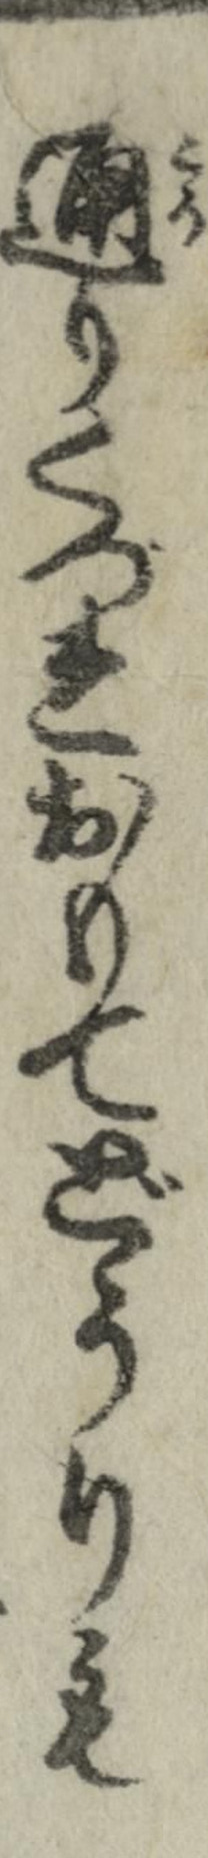通りくづれおもてどうりも
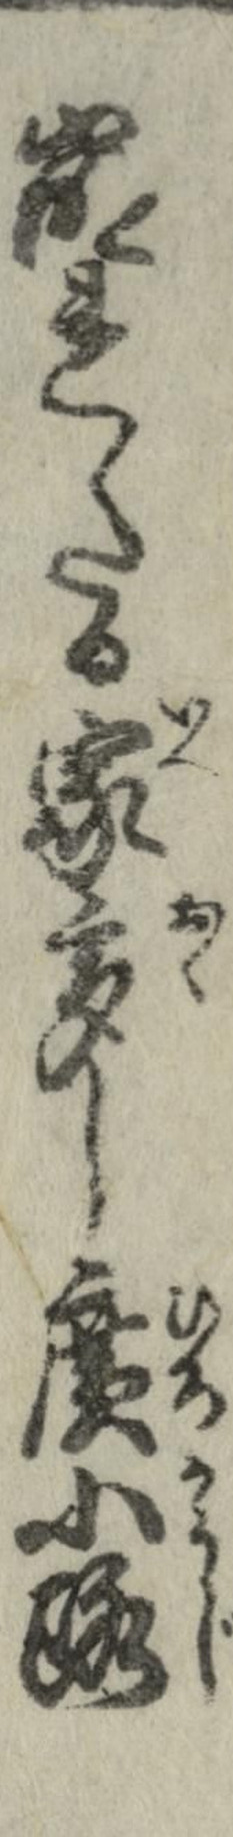崩れたる家多し廣小路
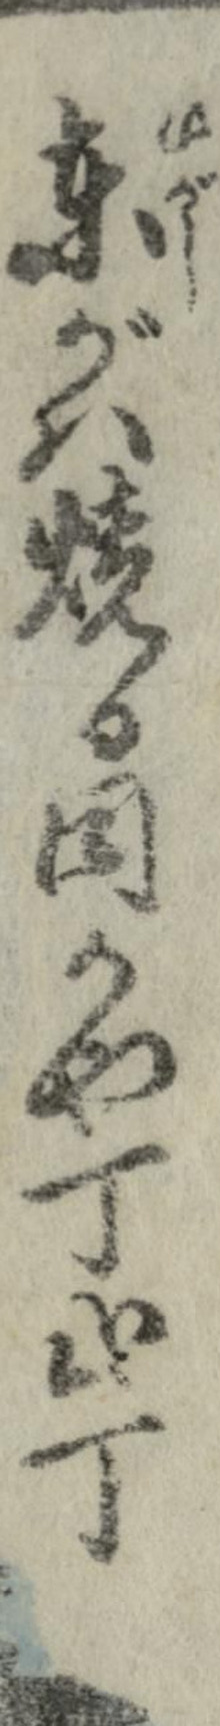東がは焼る同かや丁弐丁
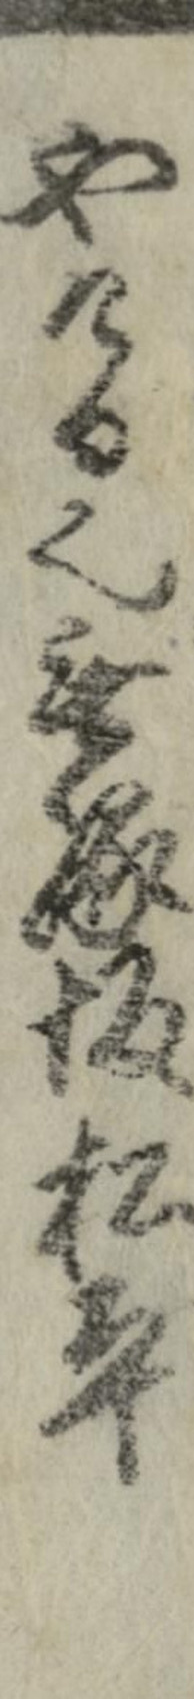やける也無縁坂松平
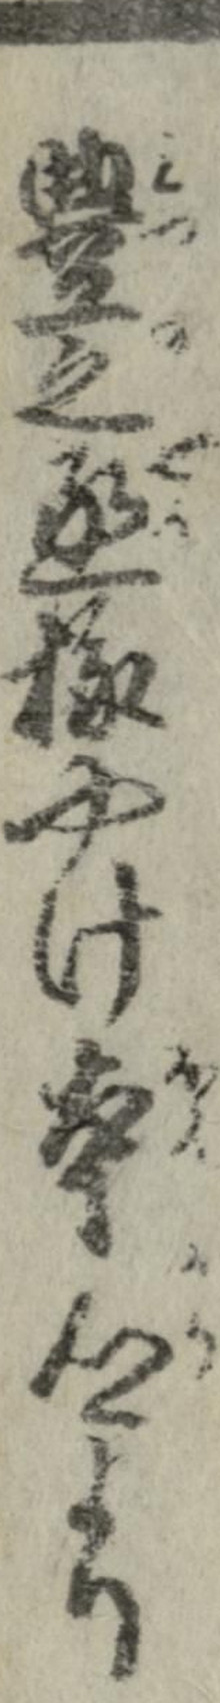豊之丞様やけ本郷より
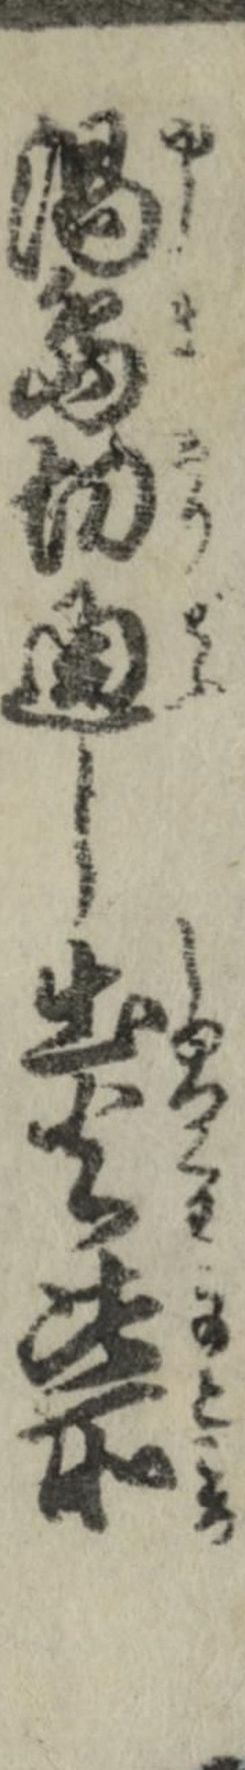湯島切通し出火此所
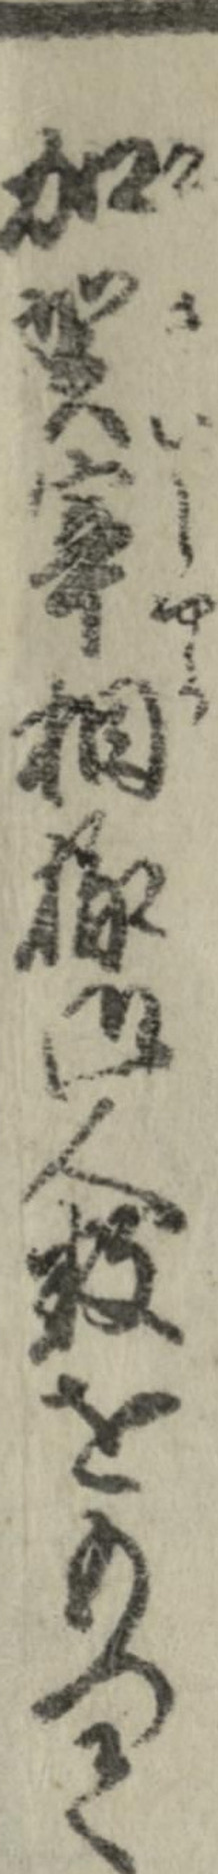加賀宰相様御人数をもつて
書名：ゆるがぬ御代要之石寿榮
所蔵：東京大学地震研究所図書室 Earthquake Research Institute Library, The University of Tokyo, JAPAN
